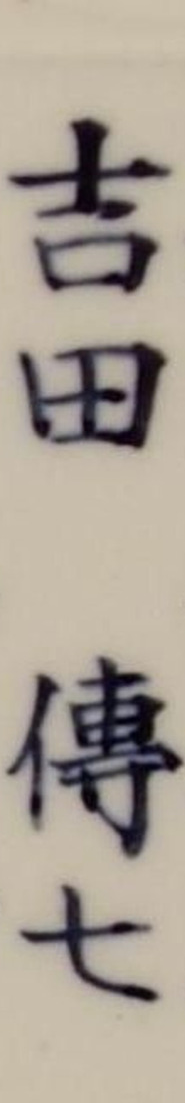吉田傳七
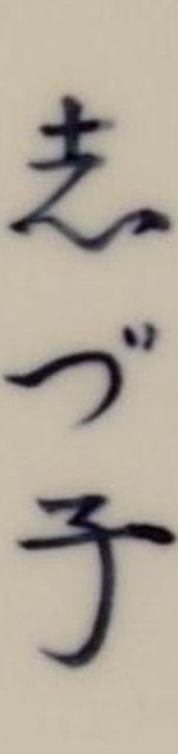しづ子
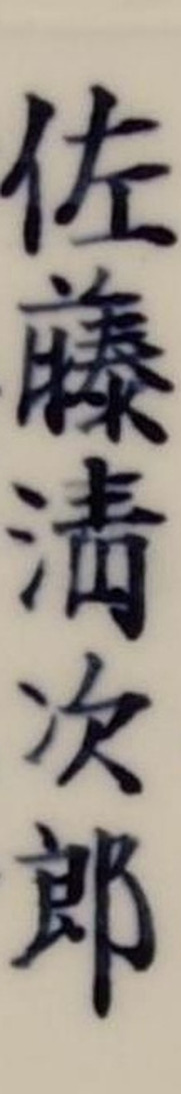佐藤清次郎
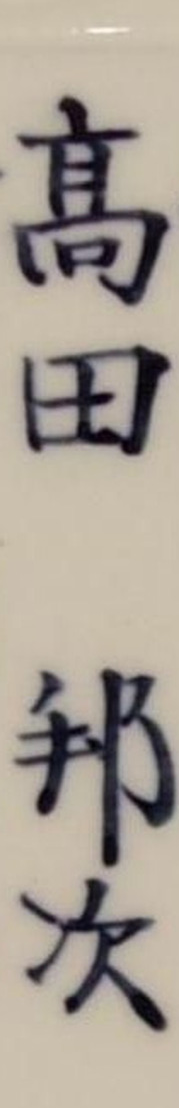高田邦次
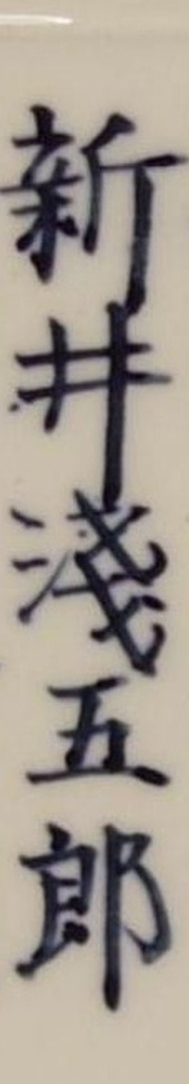新井浅五郎
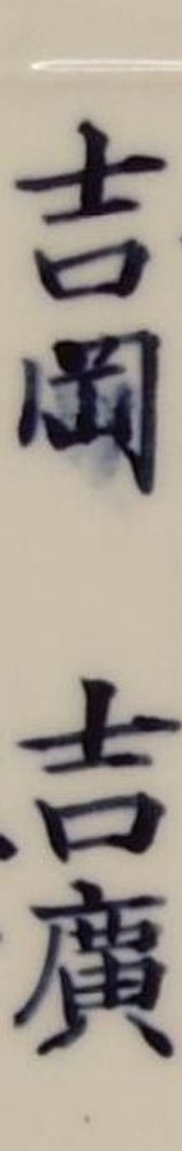吉岡吉廣
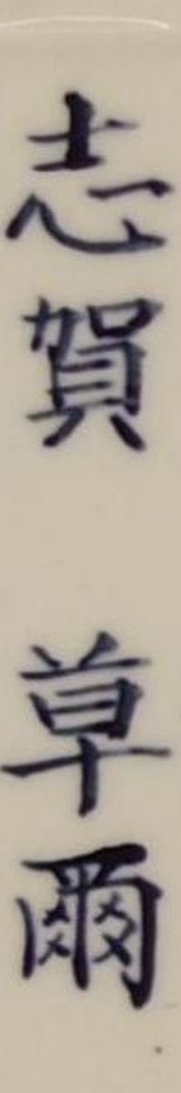志賀草爾
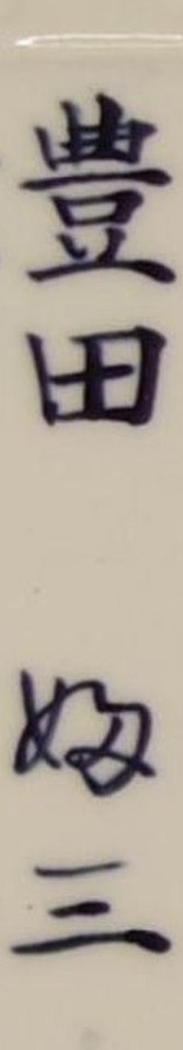豊田ふ三
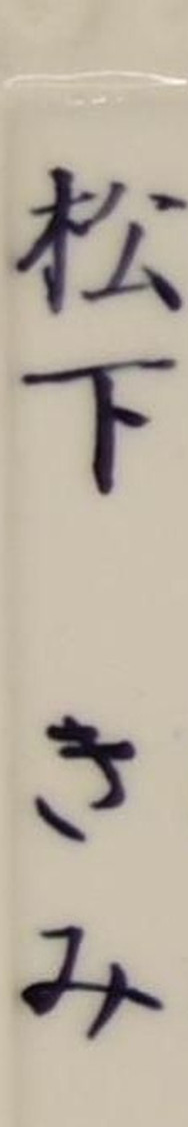松下きみ

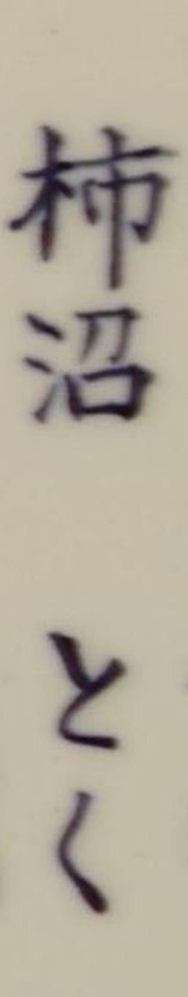柿沼とく
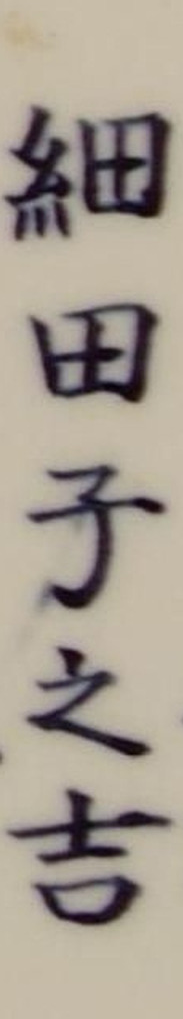細田子之吉
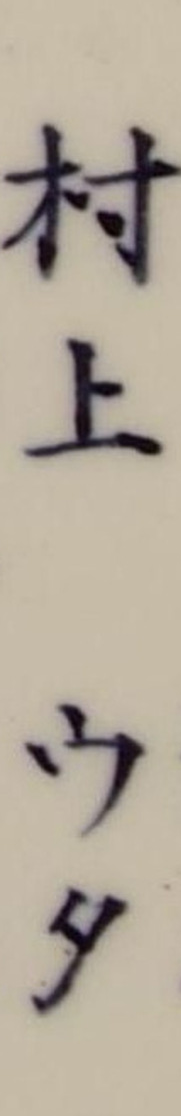村上ウタ
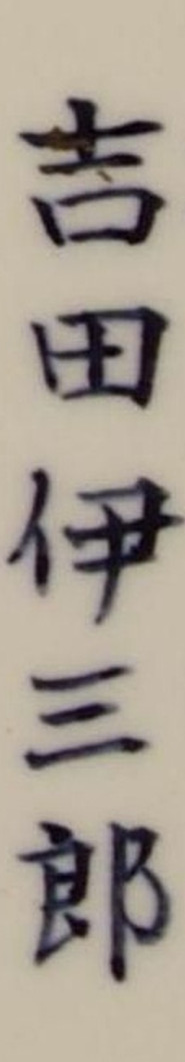吉田伊三郎
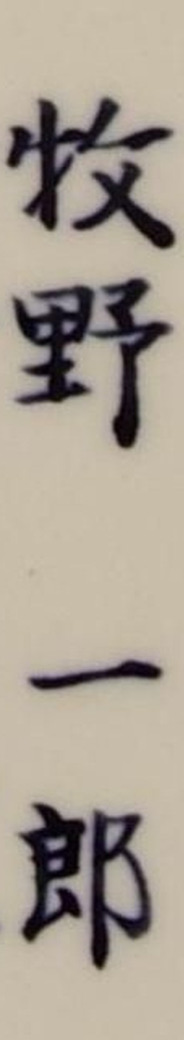牧野一郎
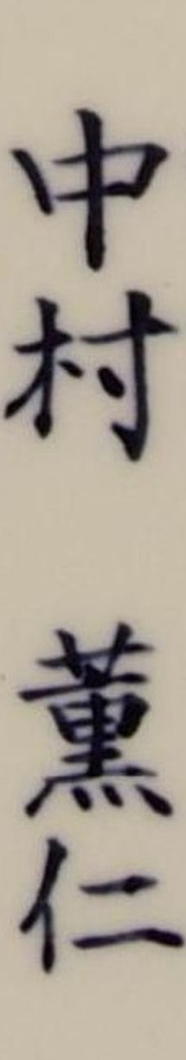中村薫仁
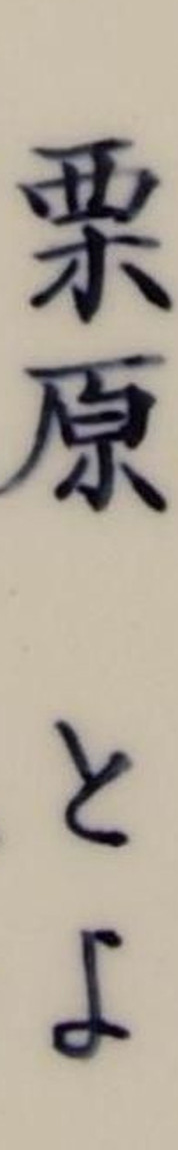栗原とよ
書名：E~L
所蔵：高野山金剛峯寺
